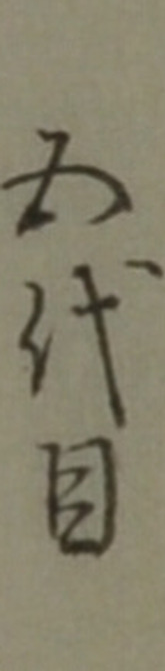五代目
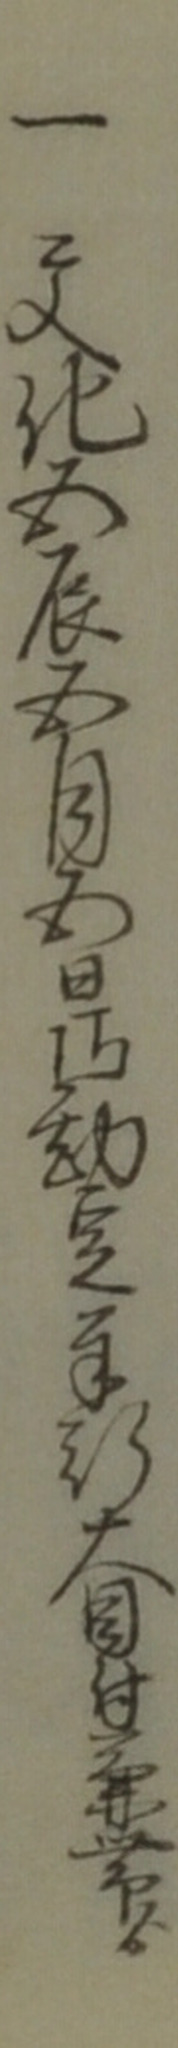一文化五辰五月五日御勘定奉行大目付兼帯ゟ
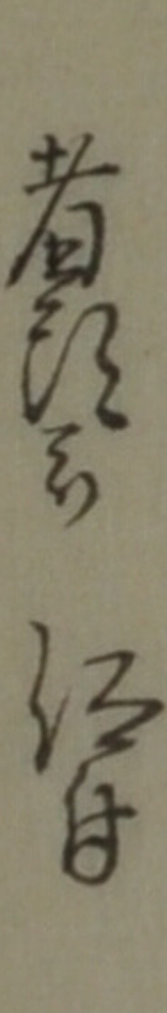者頭被仰付
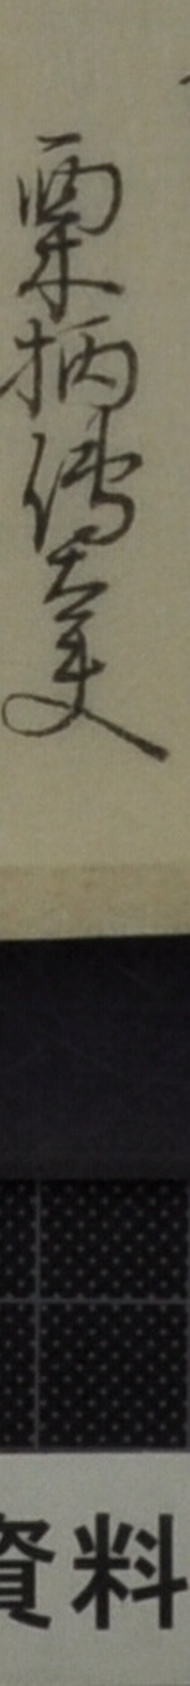栗柄傳太夫
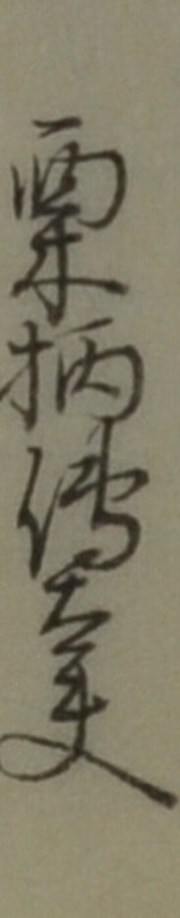栗柄傳太夫
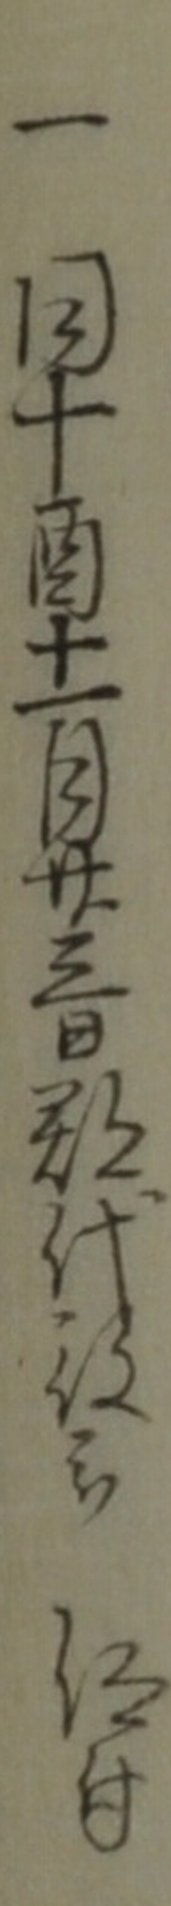一同十酉十一月廿三日郡代役被仰付
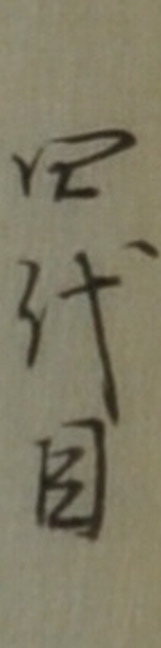四代目
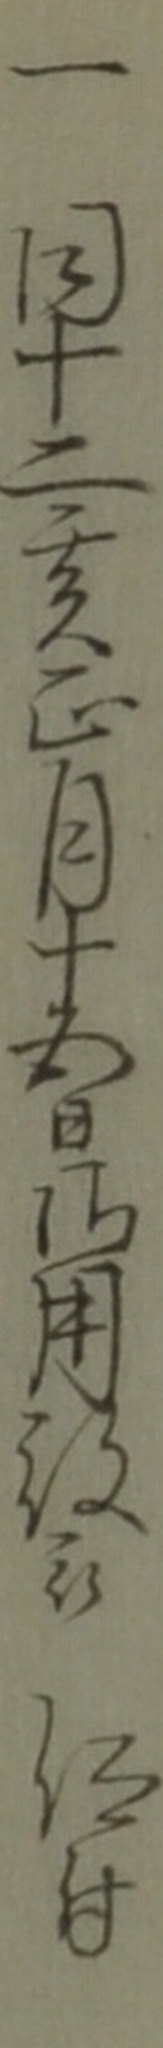一同十二亥正月十五日御用役被仰付
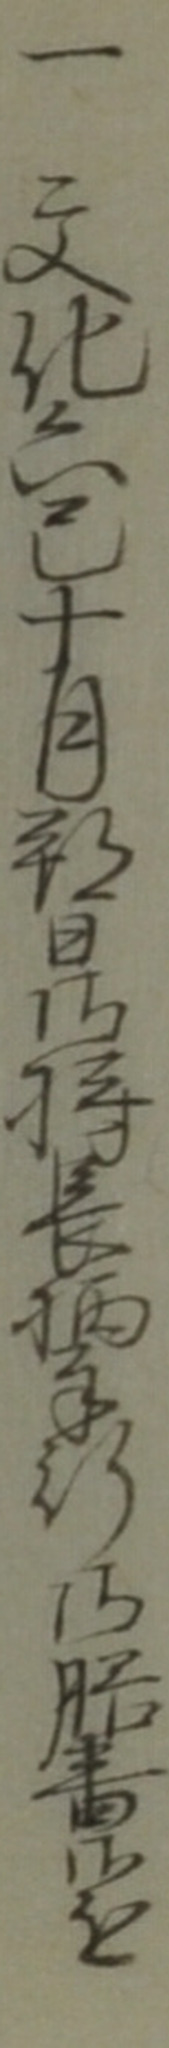一文化六巳十月朔日御持長柄奉行御膳番御近
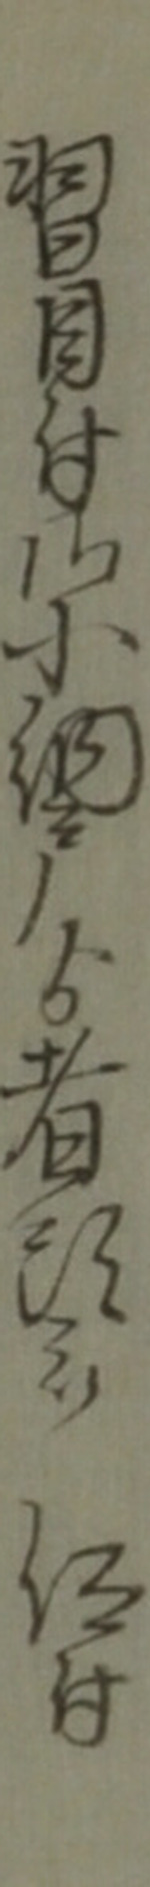習目付御小納戸ゟ者頭被仰付
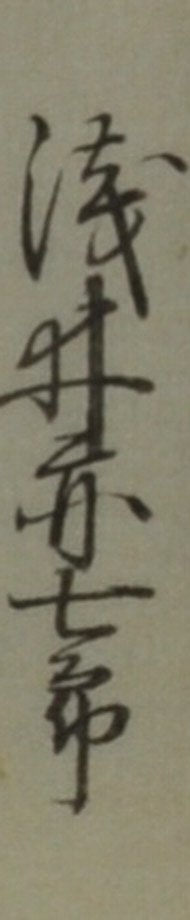浅井亦七郎
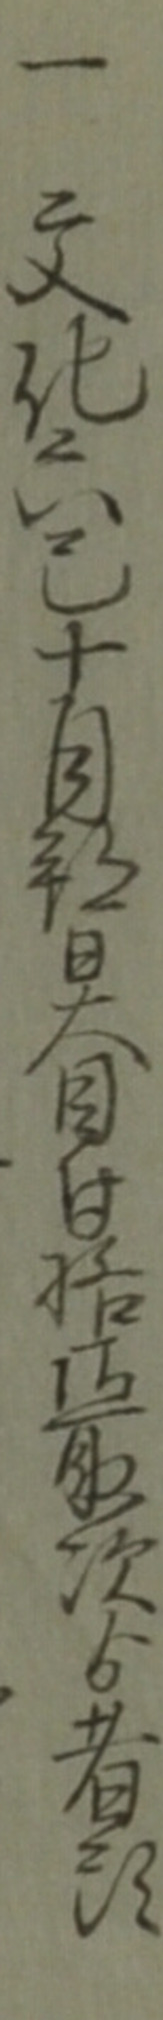一文化六巳十月朔日大目付格御取次ゟ者頭
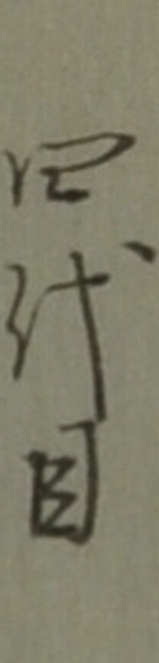四代目
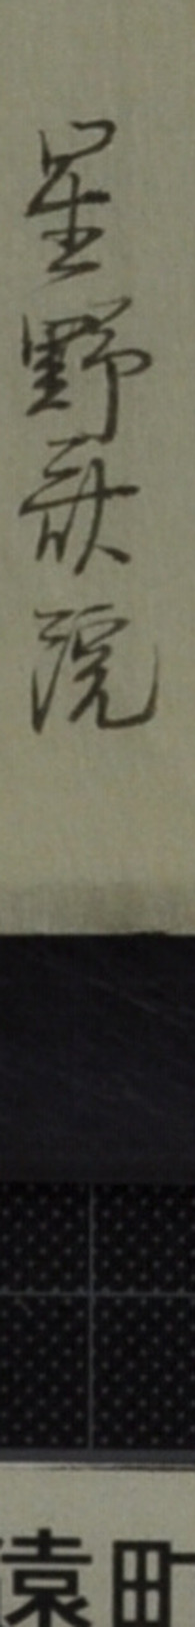星野斎院
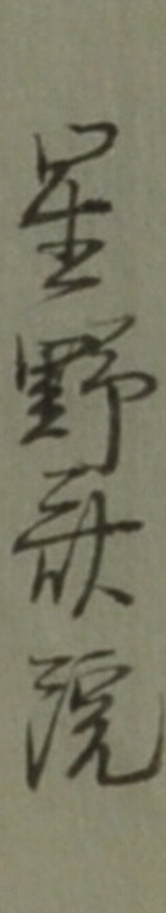星野斎院
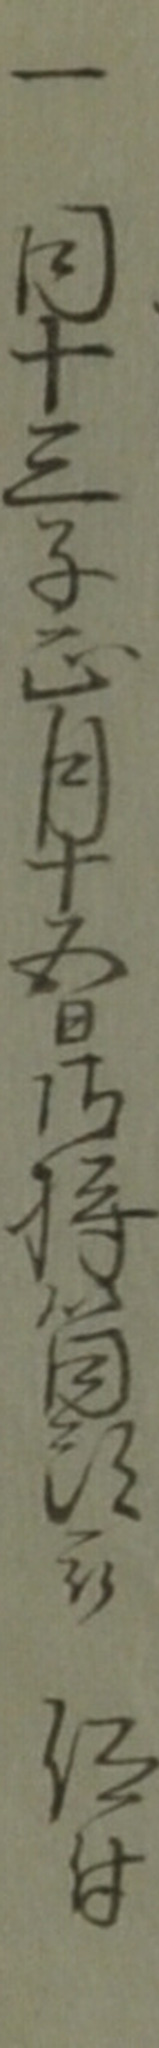一同十三子正月十五日御持筒頭被仰付
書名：諸御役代々録（二）
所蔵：伊那市立高遠町図書館・合同会社AMANE
